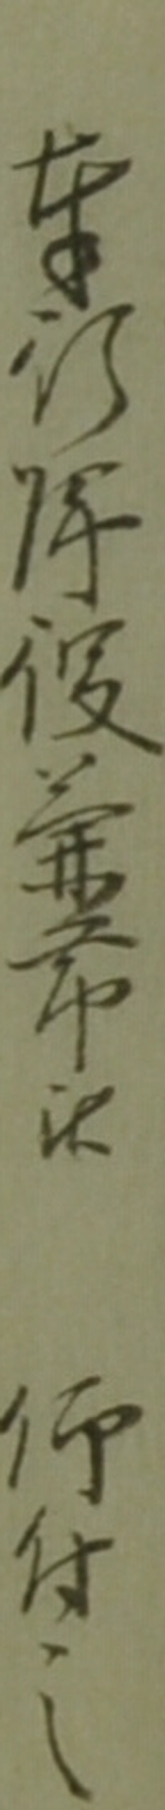奉行帰役兼帯被仰付之

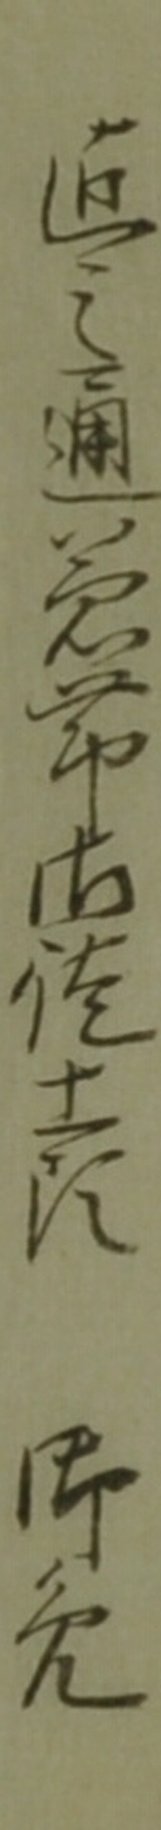迄之通兼帯御徒士頭御免
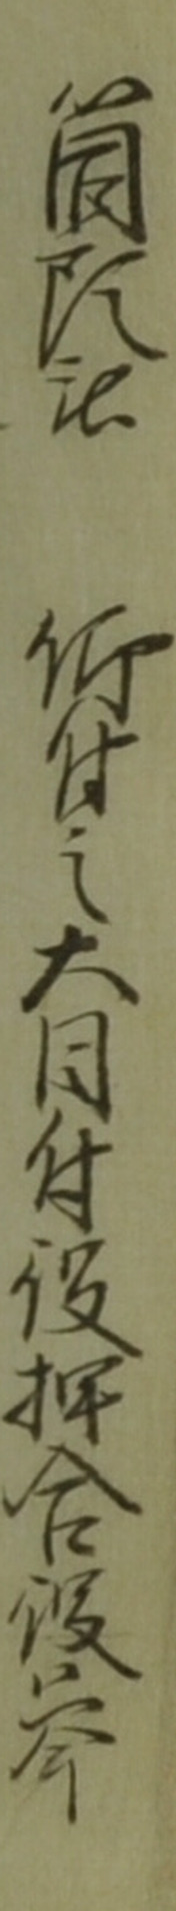筒頭被仰付之大目付役押合役只今
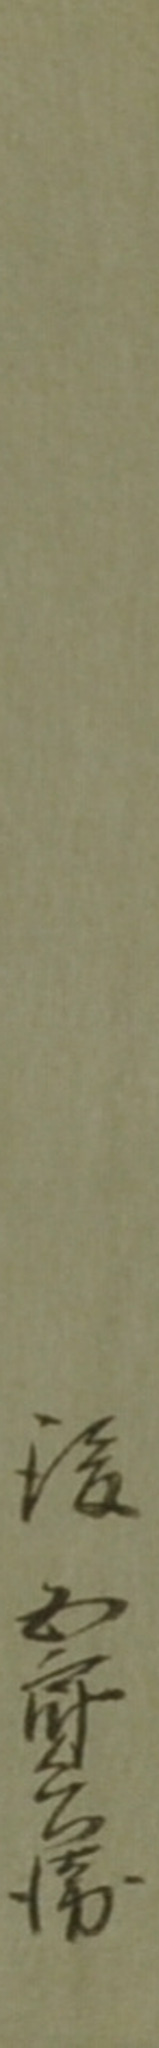後五郎兵衛
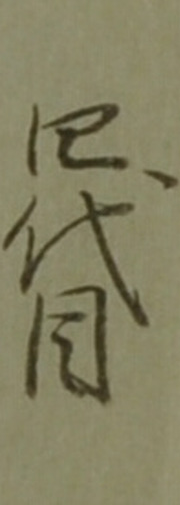四代目
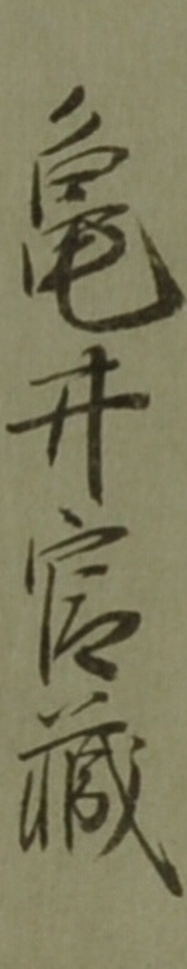亀井官蔵
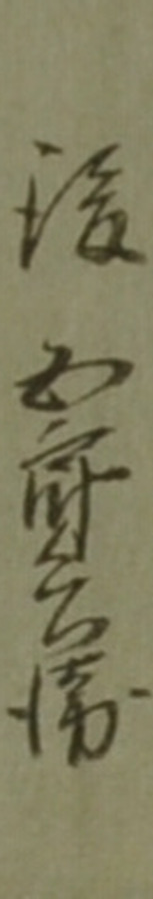後五郎兵衛
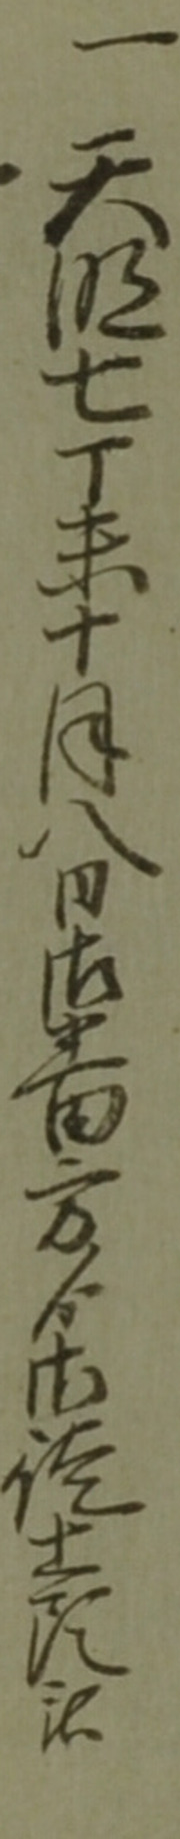一天明七丁未十月八日御番方ゟ御徒士頭被
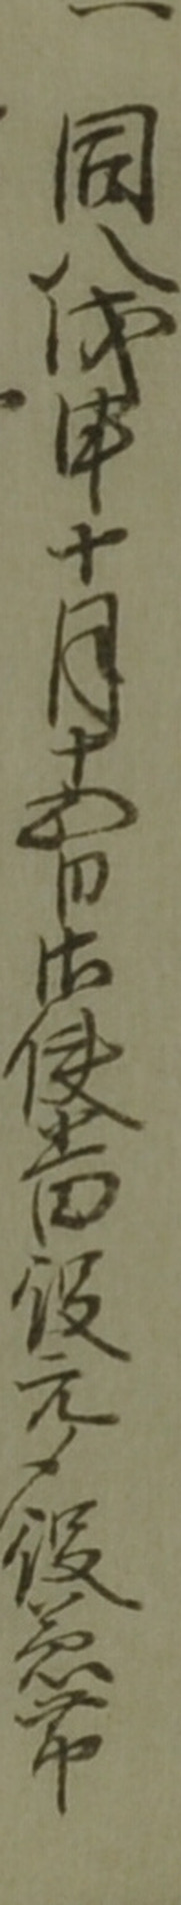一同八戊申十月十五日御使番役元〆役兼帯
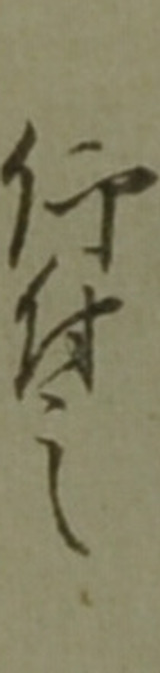仰付之
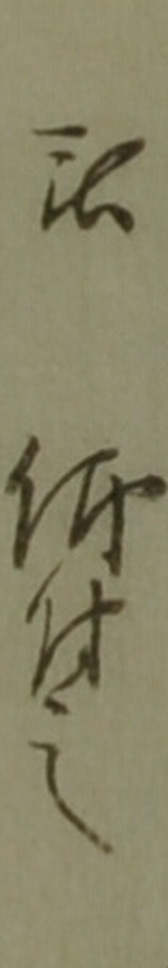被仰付之
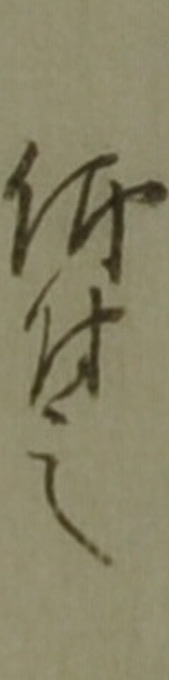仰付之
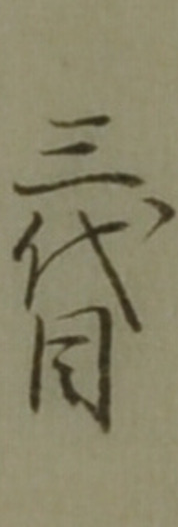三代目
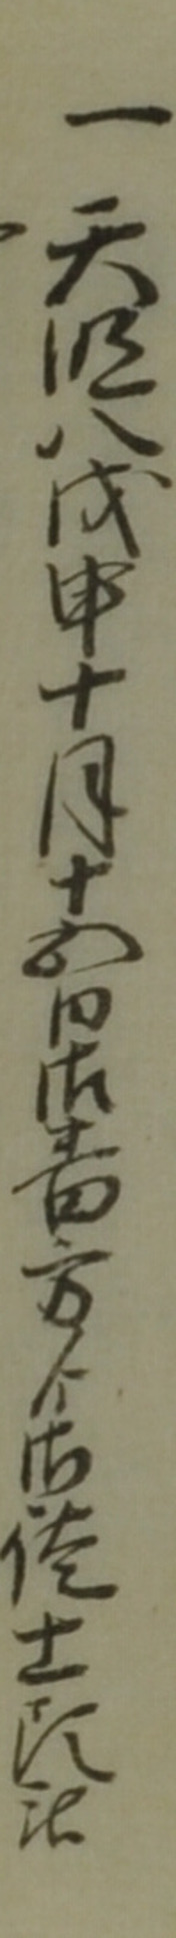一天明八戊申十月十五日御番方ゟ御徒士頭被
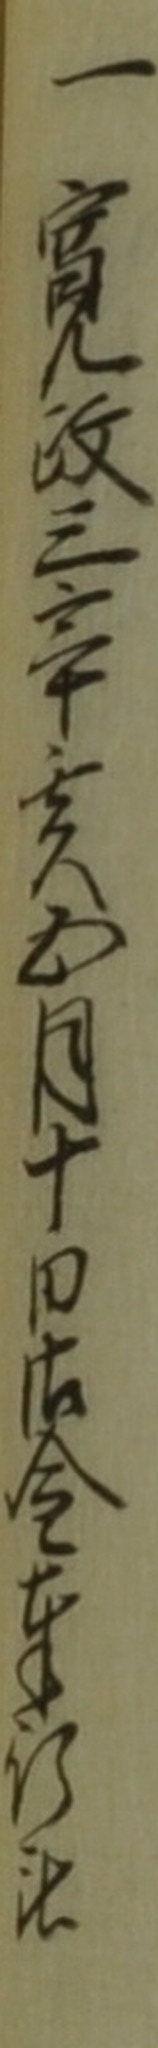一寛政三辛亥五月十日御金奉行被
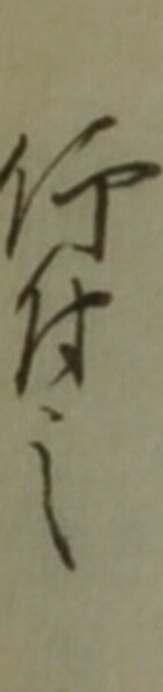仰付之
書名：諸御役代々録（六）
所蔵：伊那市立高遠町図書館・合同会社AMANE
